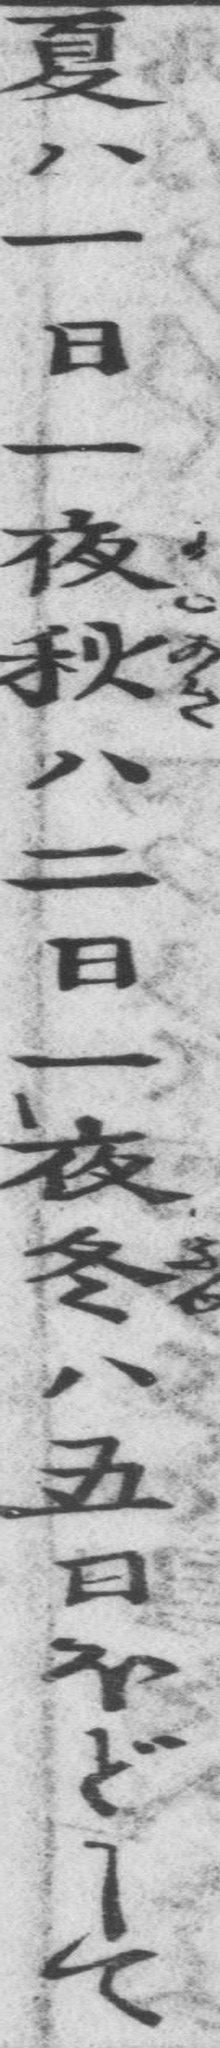夏は一日一夜。秋は二日一夜冬は五日ほどして
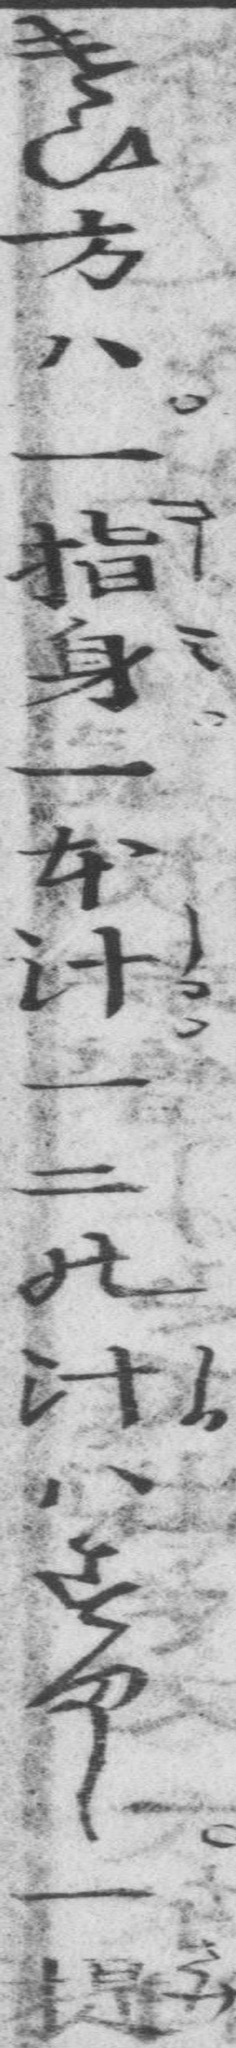遣ひ方は。一指身。一本汁。一二の汁はすまし。一提
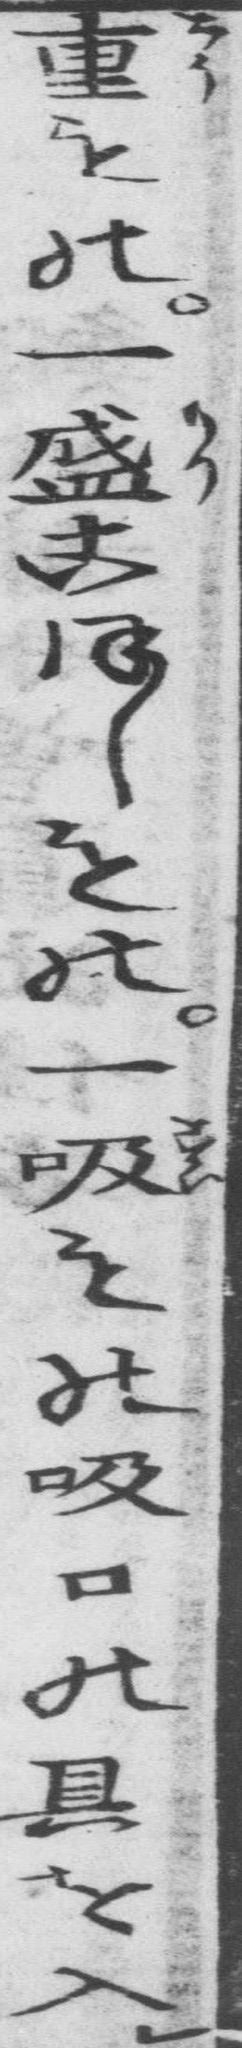重もの。一盛こほしもの。一吸もの吸口の具を入れ
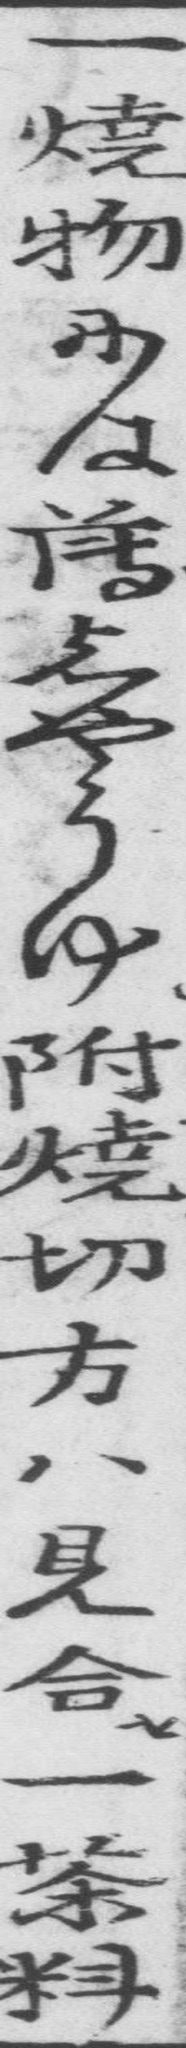一焼物には。薄しやうゆ。附焼。切方は見合せ一茶料
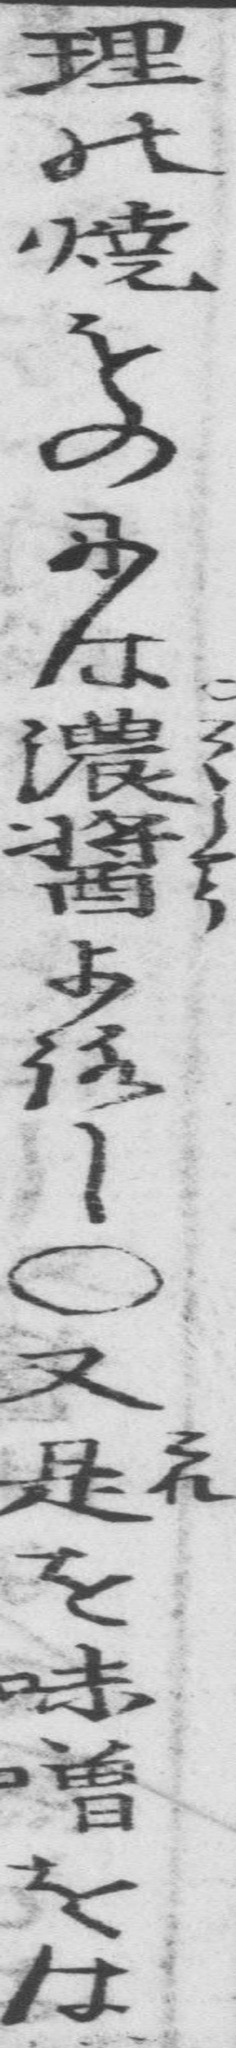理の焼ものには。濃醤よろし○又是を味噌をは
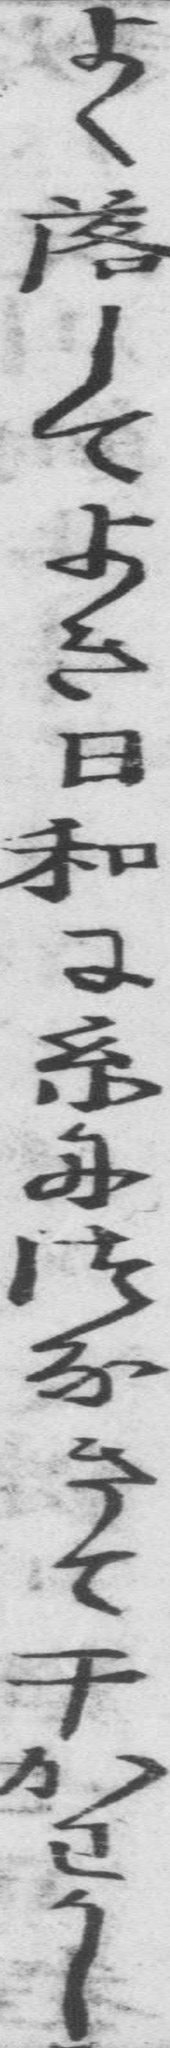よく落してよき日和に。糸につなきて。干かわかし
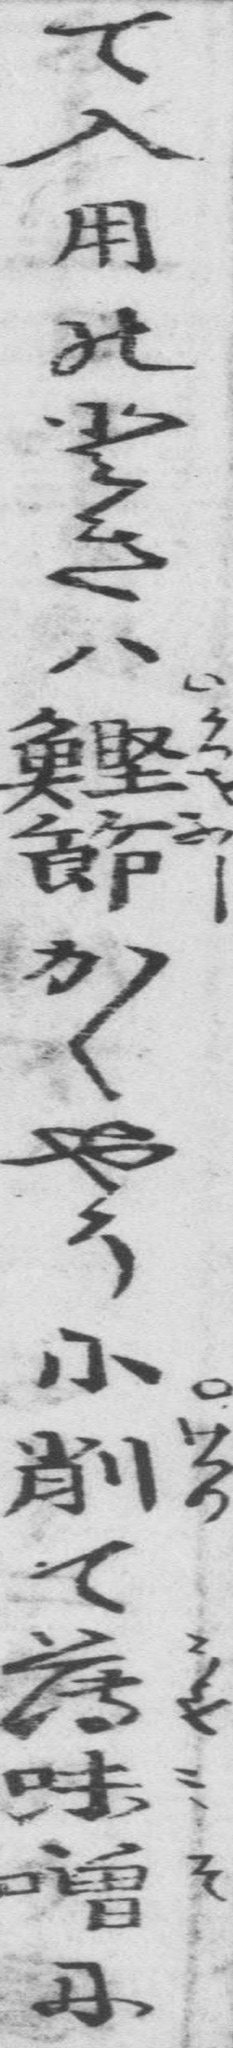て入用のときは。鰹節かくやうに。削て薄味噌に
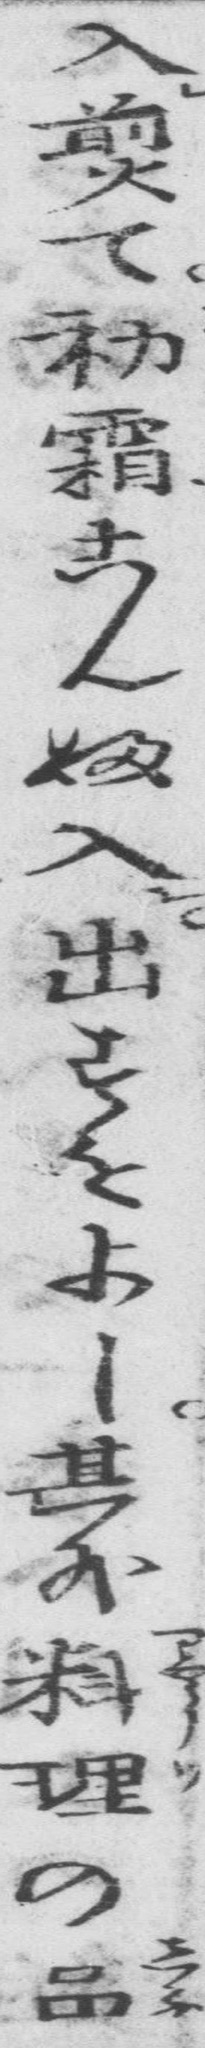入れ煎て。初霜こんふ入れ。出すもよし。其外料理の品
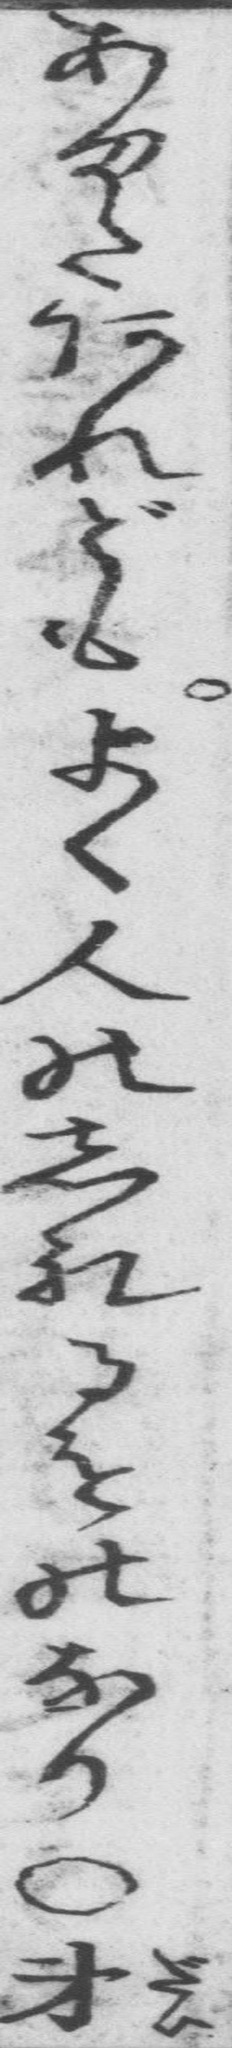あまたあれども。よく人のしれるものなり○第
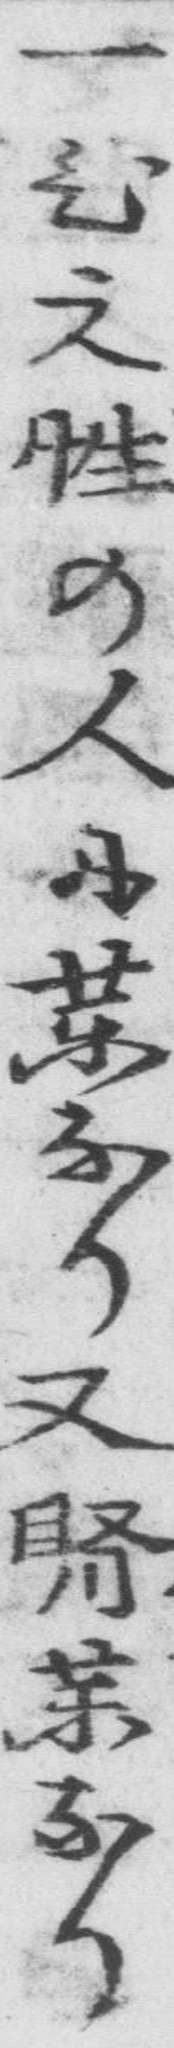一ひえ性の人に。薬なり。又腎薬なり
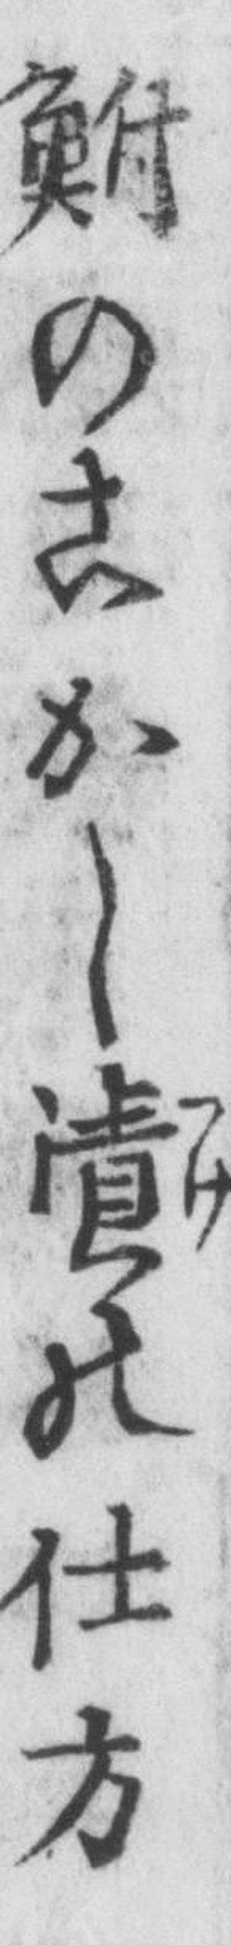鮒のこかし漬の仕方

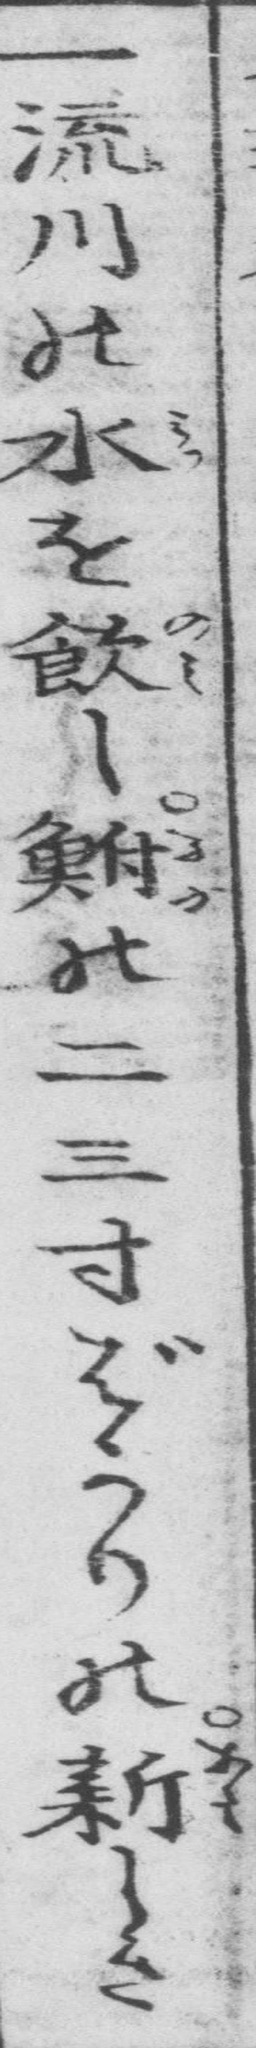一流川の水を飲し。鮒の二三寸ばかりの。新しき
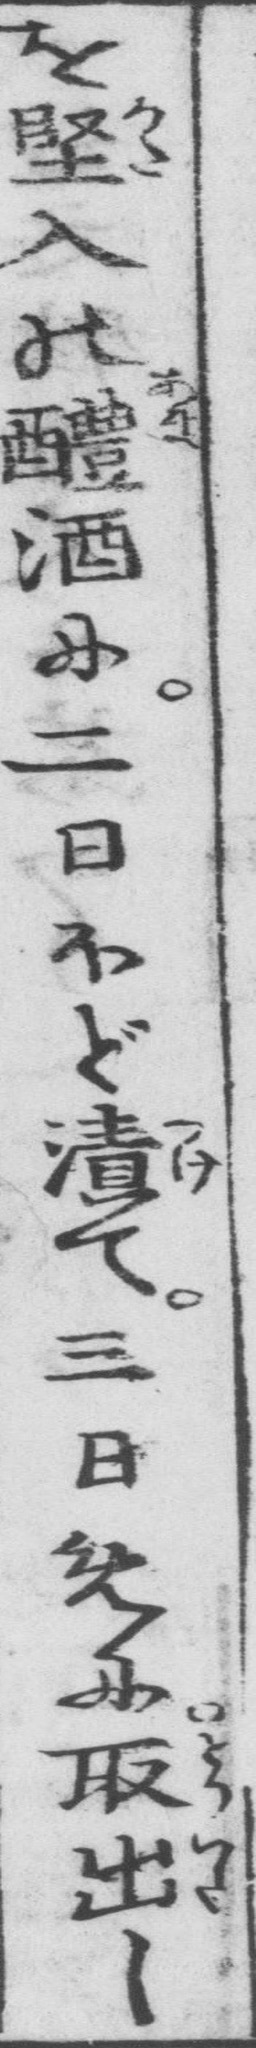を堅入の醴酒に。二日ほど漬て。三日めに。取出し
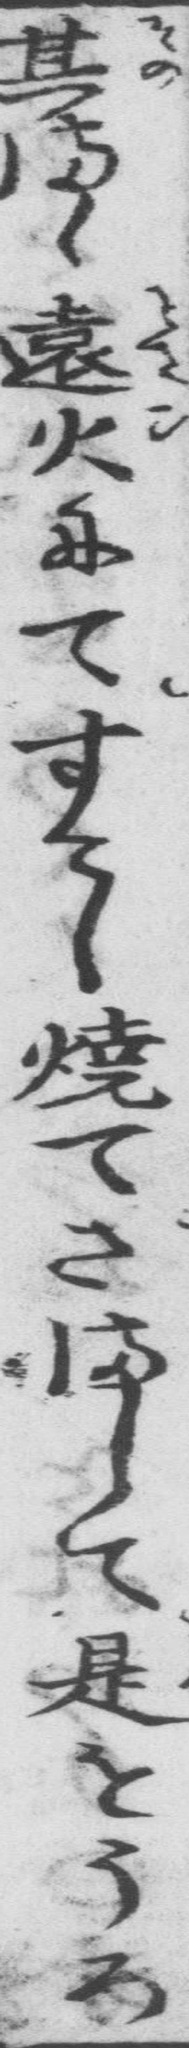其まゝ遠火にて。すこし焼て。さまして。是をうろ
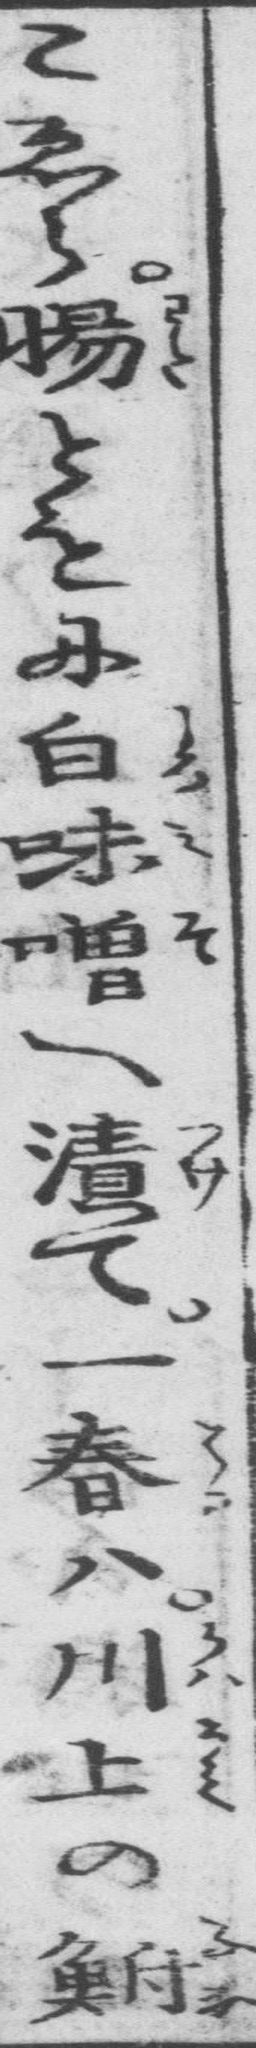こゑら。腸ともに白味噌へ漬て。一春は。川上の鮒
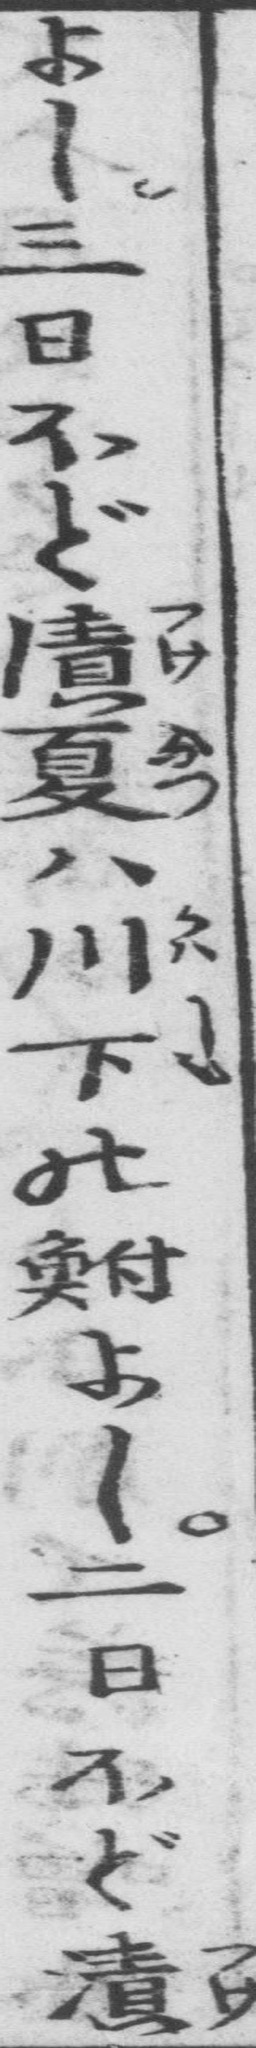よし。三日ほど漬夏は川下の鮒よし。二日ほど漬
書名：萬寳料理秘密箱
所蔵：大阪府立大学学術情報センター 国文学研究資料館
